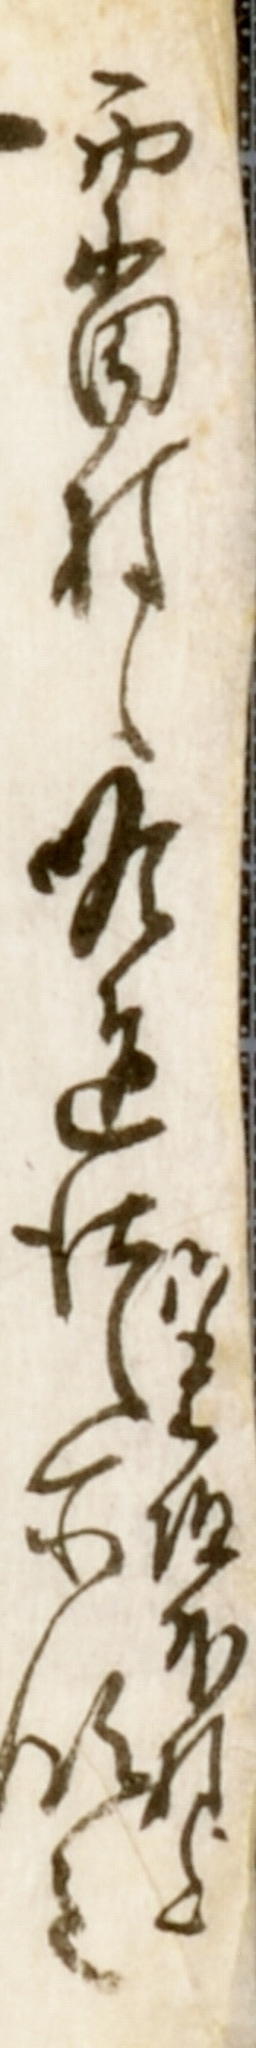西番村へ順達仕候所領主
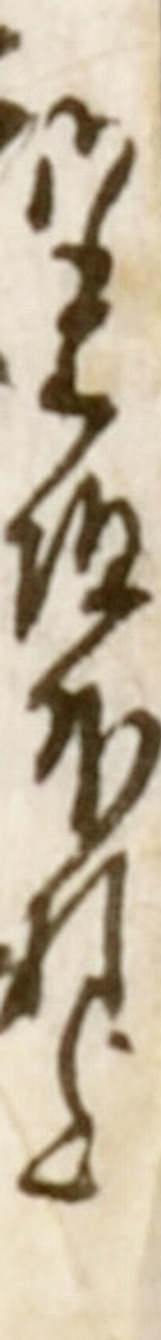御手代外村迄
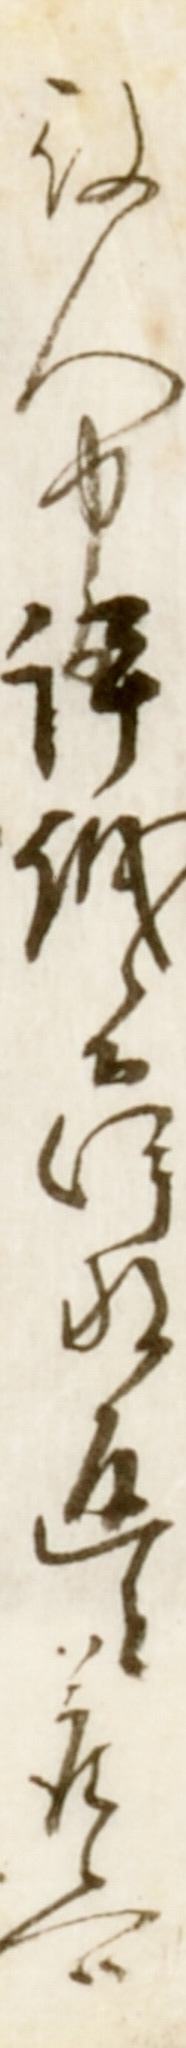役人中評議ニ而伊那迄と差しハ
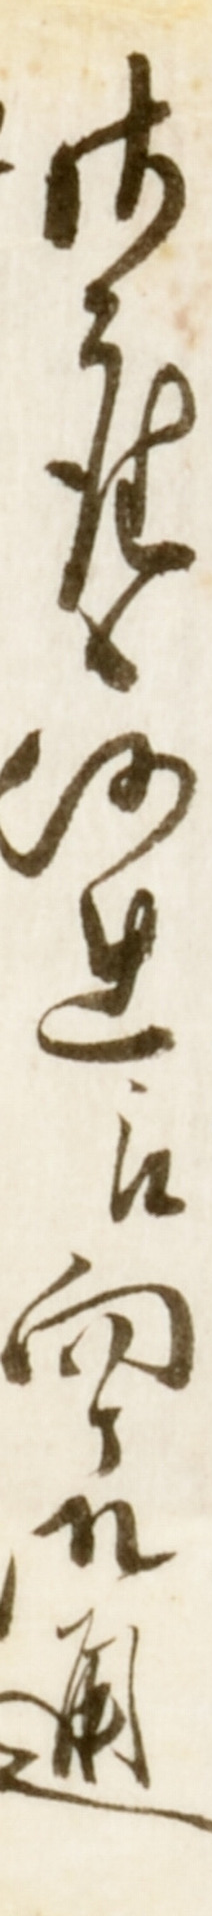御座候何れ江向は御通
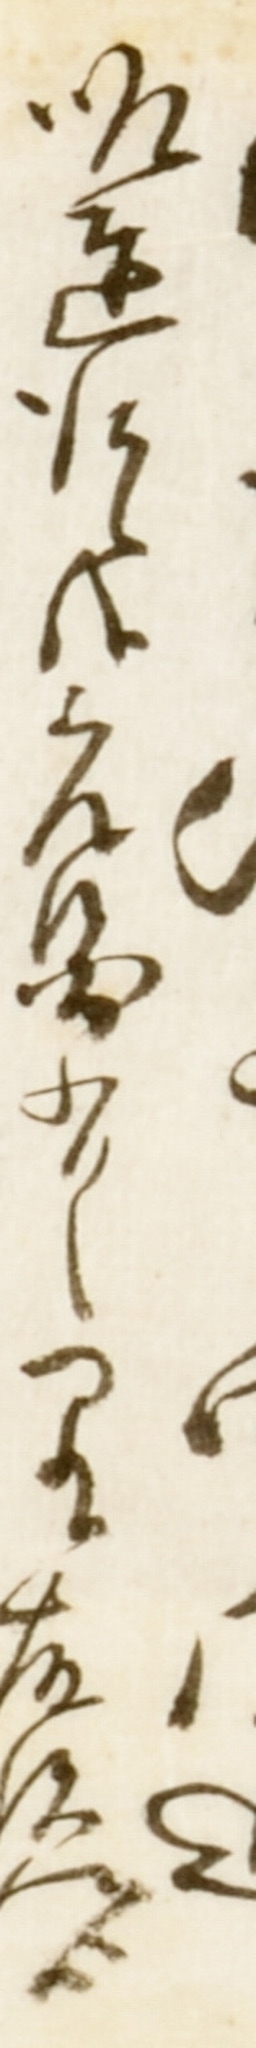順達仕候差図有之間は藤沢郷より
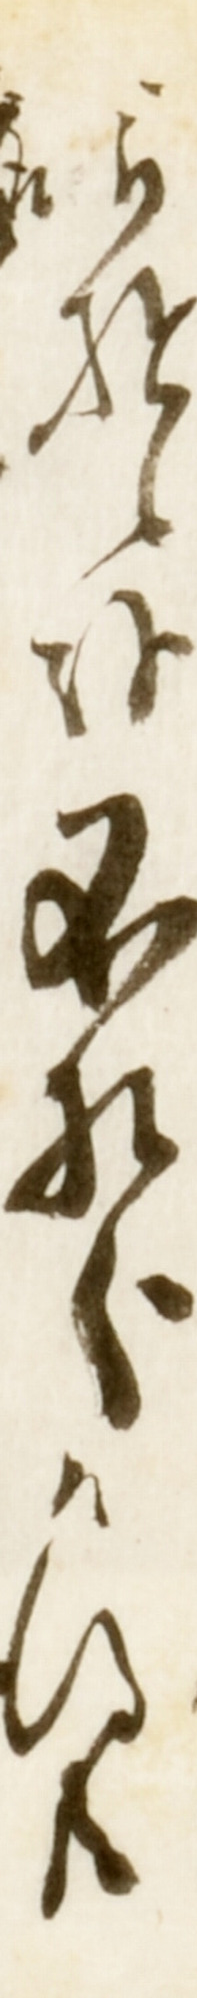被遊候不相分候得共
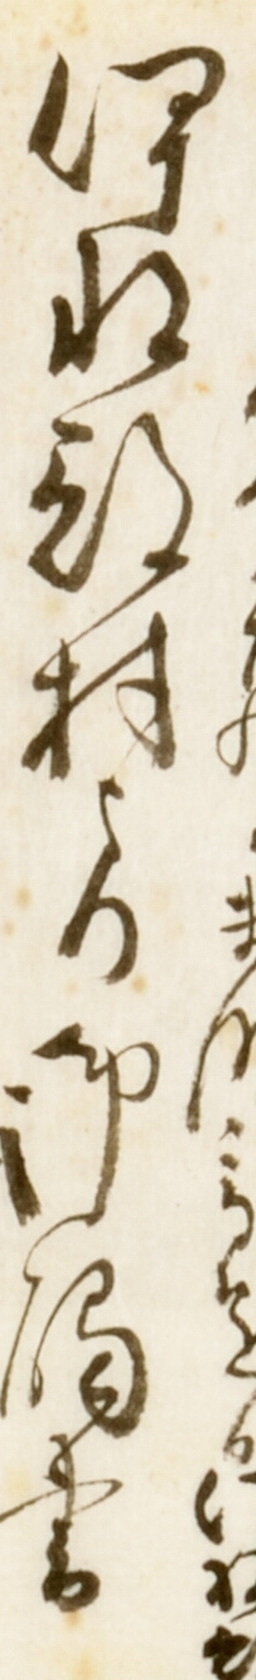伊那部村より御触書
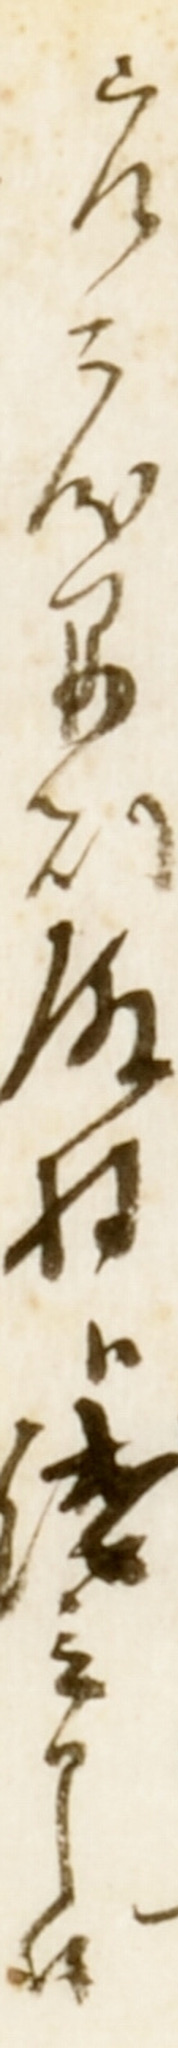差着早刻殿村江継立申候
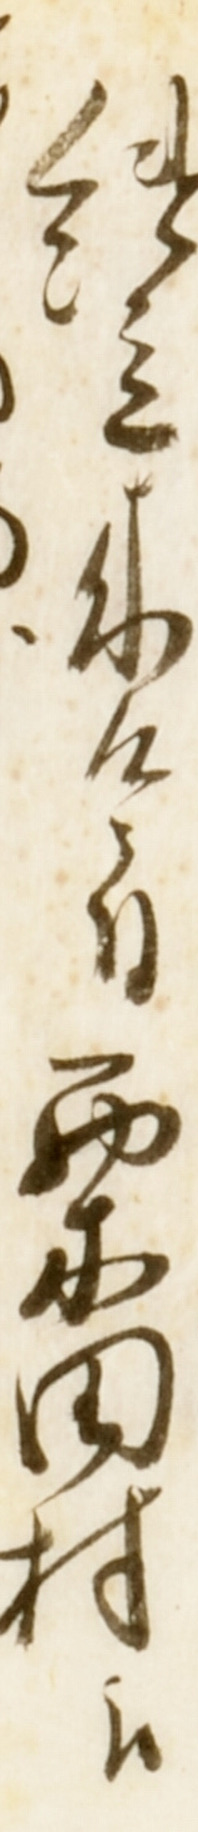継立来候ニ付栗田村江
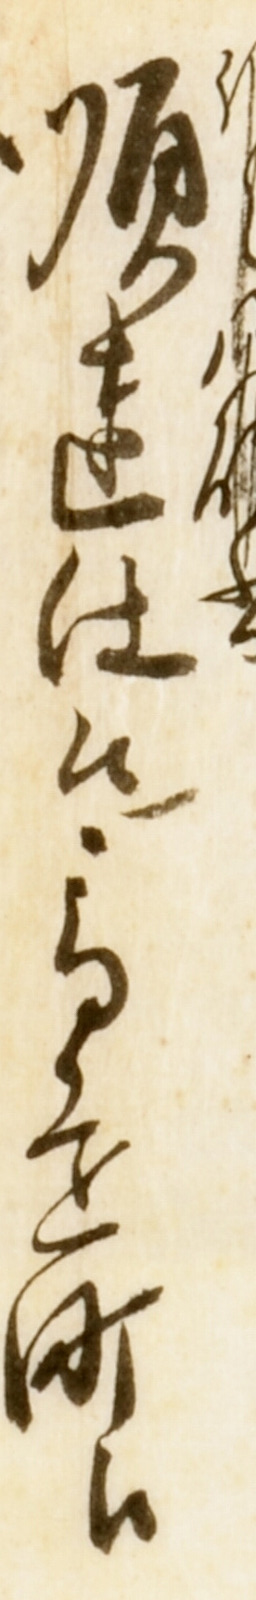順達仕候高遠町江
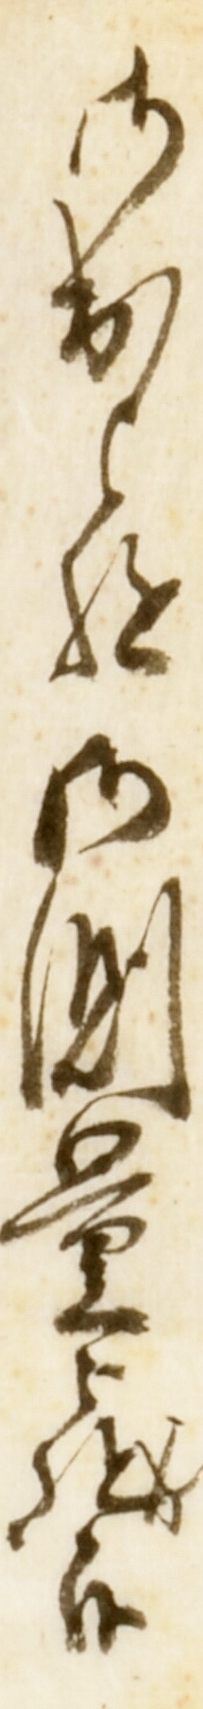御出被遊御測量被遊候
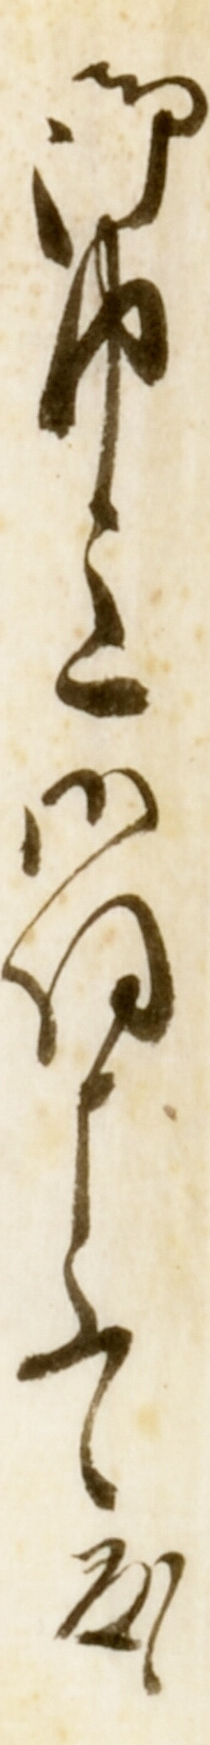御申上御伺申上候度々
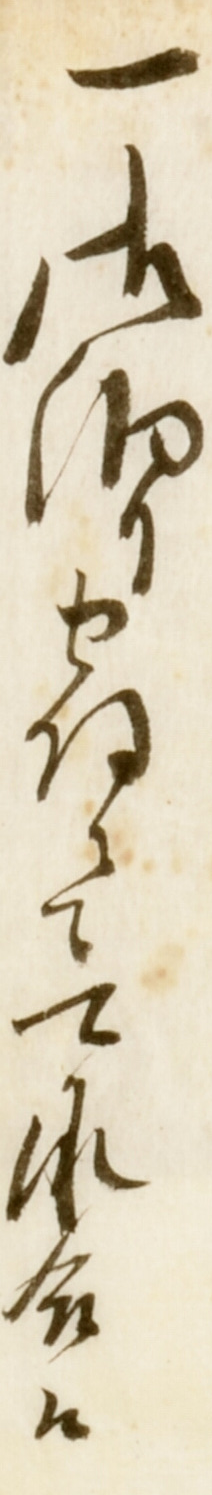一御泊り宿ニて可承合候
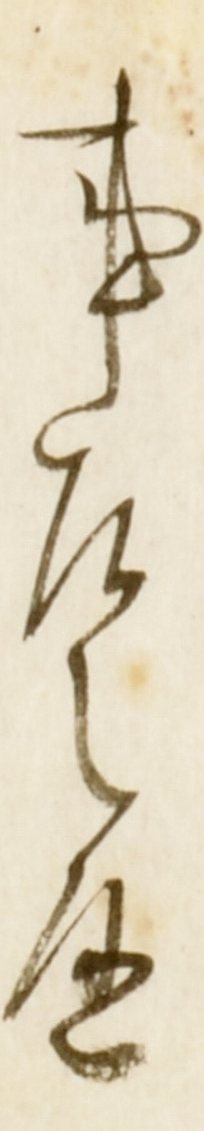事左之通
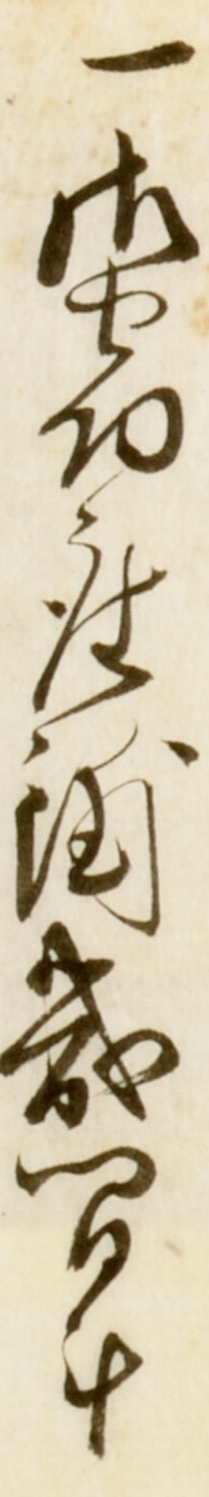一御着座鋪幾間図
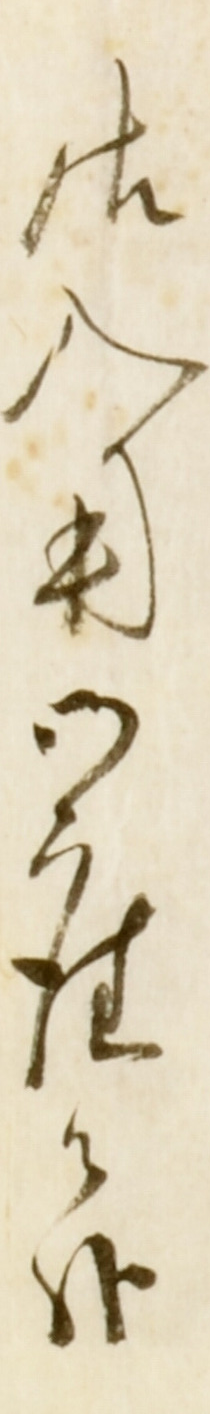御入用御座候哉
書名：（覚）
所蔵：伊那市立高遠町図書館・合同会社AMANE
